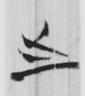之
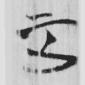正
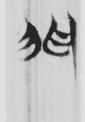門
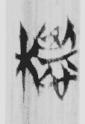檻
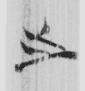之
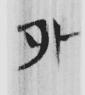外
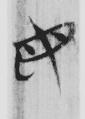母
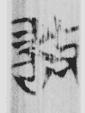敢
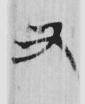又
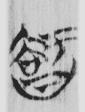智
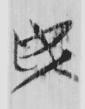𡚦
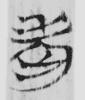老
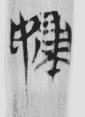婦
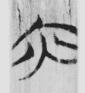亦
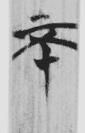不
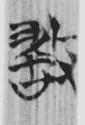敢
